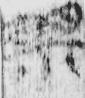○（盟）
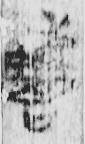○（證）
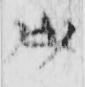凡
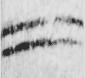二
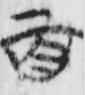百
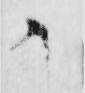人
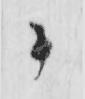十
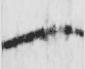一
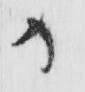人
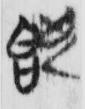既
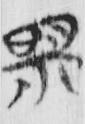○（盟）
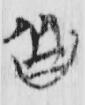皆
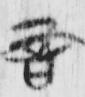言
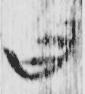曰
